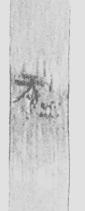九十=
